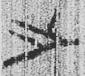之
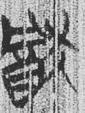猶
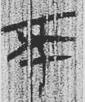不
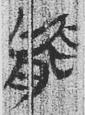能
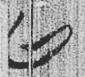㠯（以）
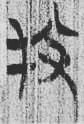牧
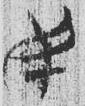民
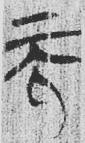而
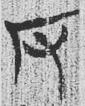反
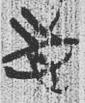志
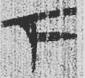下
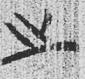之
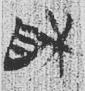相
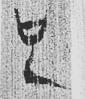也
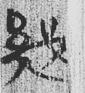幾（豈）
